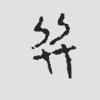兵
